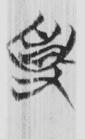事
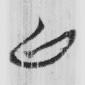㠯（以）
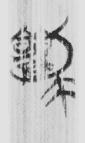勸
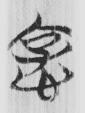{免心}
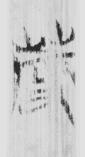蓐
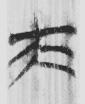夫
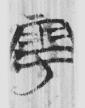𩁹
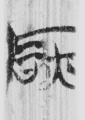庶
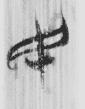民
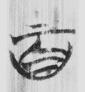百
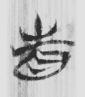眚
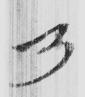乃
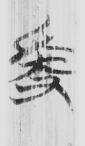爯
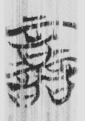譶
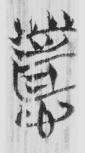{丵耳心}
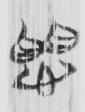{䀠心}
